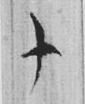十
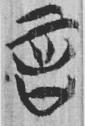言
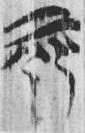而
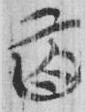百
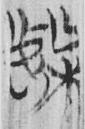殜（世）
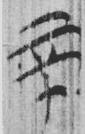不
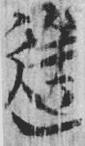○（失）
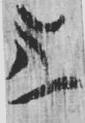之
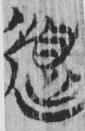道
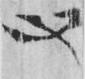又（有）
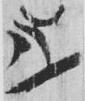之
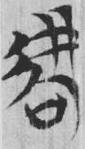唬（乎）
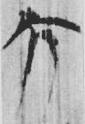大（太）
